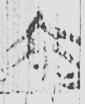六十=
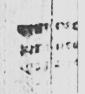三
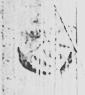百
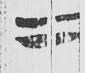二
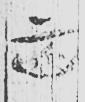百
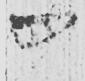四
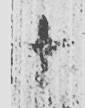十
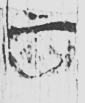百
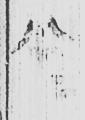八十=
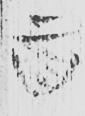百
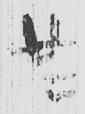廿=
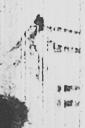六十=
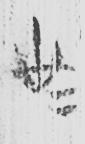卅=
